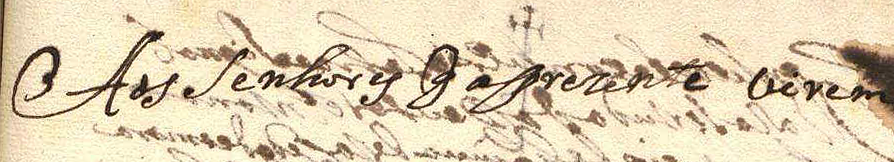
Aos senhores q̄ a prezente virem
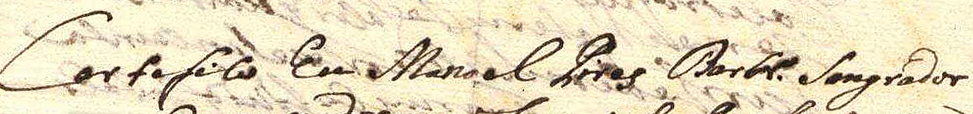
Certefico Eu Manoel Pires Barbr.o sangrador
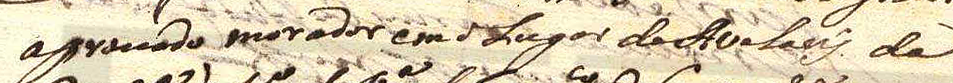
aprouado morador em o Lugar de Avelans̄ da
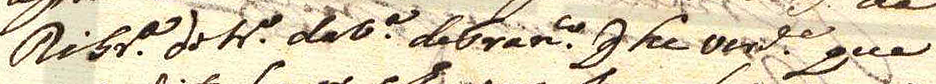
Ribr.a do tr.o da v.a de Tran.co q̄ hé verd.e que
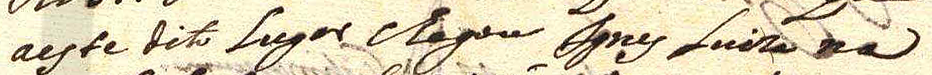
a este dito Lugar chegou Jgnes Luiza na
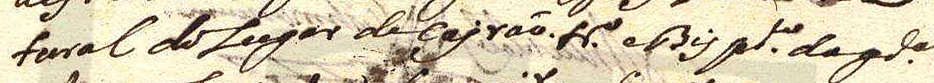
tural do Lugar de cajraõ. tr.o e Bispd.o da gd.a
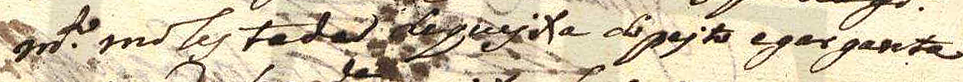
m.to molestada de quejiXa de pejto e garganta
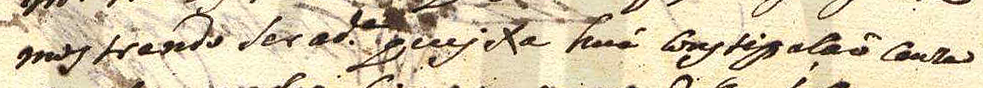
mostrando ser a d.a quejXa huā constipaÇaõ cauza
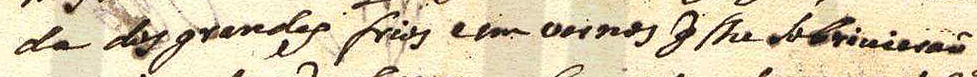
da dos grandes frios e imvernos q̄ lhe sobriuieraõ
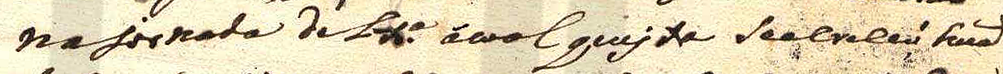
na jornada de Lx.a á coal quejXa se acreceó, huā
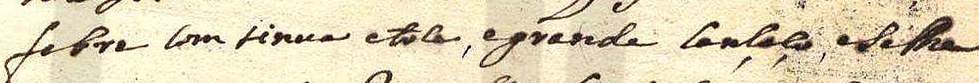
febre comtinua e toce, e grande Cançaço, e Se lhe
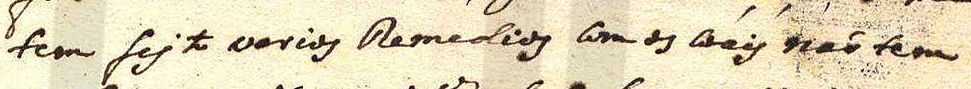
tem fejto varios Remedios com os coais naõ tem
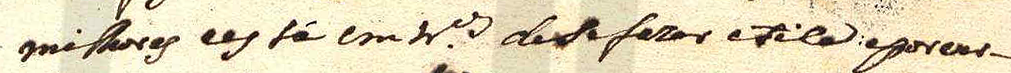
milhoras e está em tr.os de se fazer etica e por uer
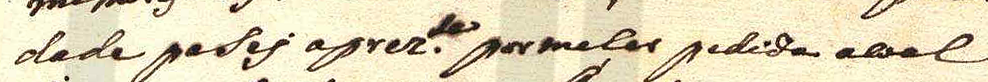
dade pasej a prez.te por me Çer pedida a coal
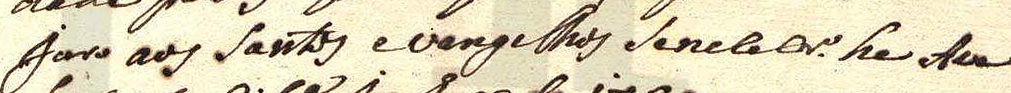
Juro aos santos evangelhos se neCecr.o he Aue
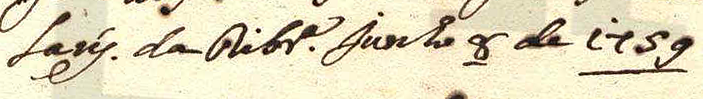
lan̄s da Ribr.a Junho 8 de i759
